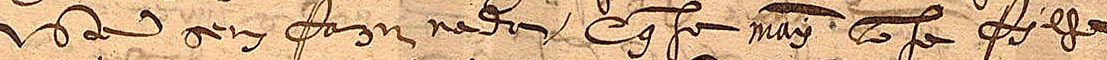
estā sem fazer nada / e q̄ ha mãy cō ha fylha
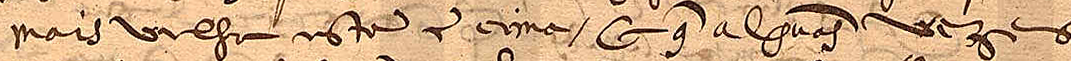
mais velha estā ē cima / E q̄ algūas vezes
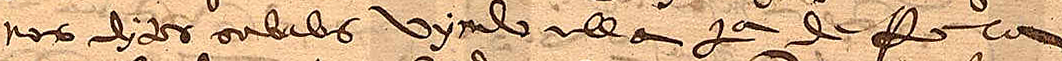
nos dytos sabados vyndo ella ta de fora
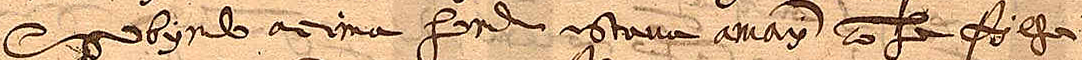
e sobyndo acima honde estaua a mãy c̄o ha fylha
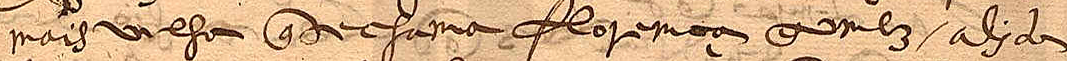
mais velha q̄ se chama floremça gomez / a dyta
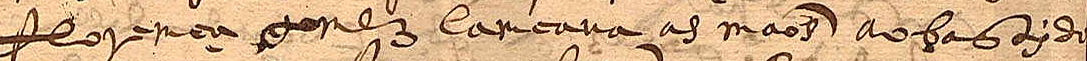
floremça gomez lamcaua as maõs ao bastydo
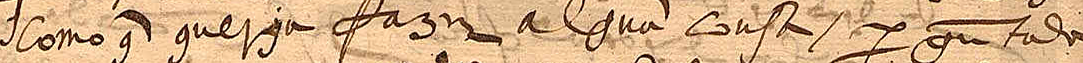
Como q̄ querya fazer algūa cousa / ꝑgūtada
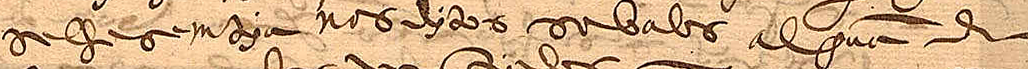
se lhe semtya nos dytos sabados algūa de
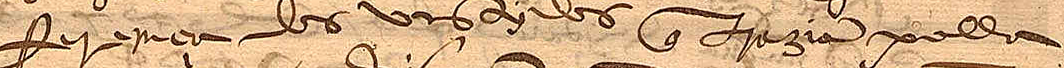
feremça dos vestydos q̄ traziā polla
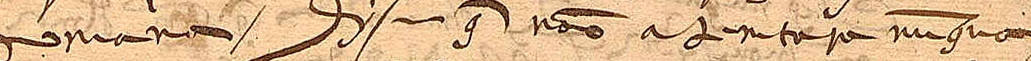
somana / dyse q̄ não atemtara n̄uqua
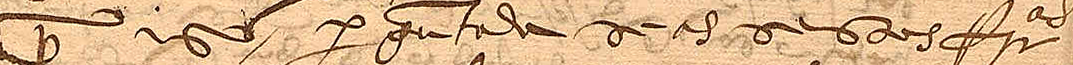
p̄o iso / ꝑgūtada se as sestas fras
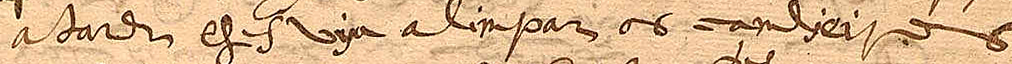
a tarde lhes vya a limpar os camdyeiros
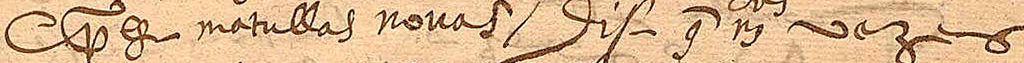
e p̄o lhe matullas nouas / dise q̄ mtas vezes
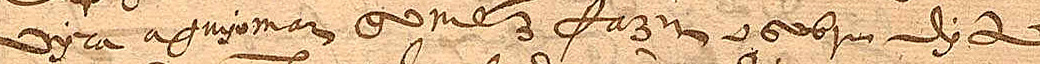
vyra a guyomar gomez fazer o sobredyto
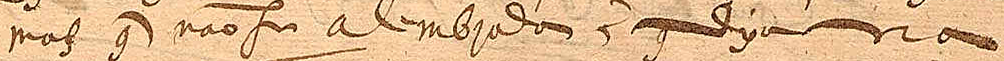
mas q̄ não he alembrada ē q̄ dya era
